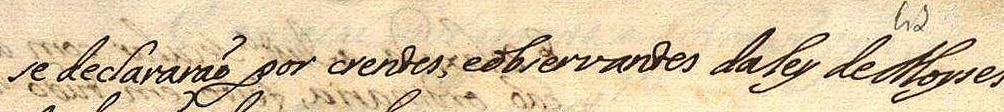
se declararaõ por crentes, e observantes da ley de Moyses
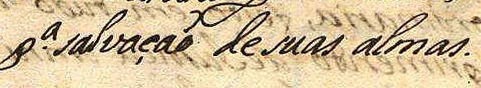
p.a salvaçaõ de suas almas.
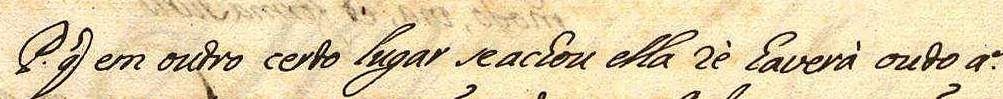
P. q̄ em outro certo lugar se achou ella ré haverà outo ā.
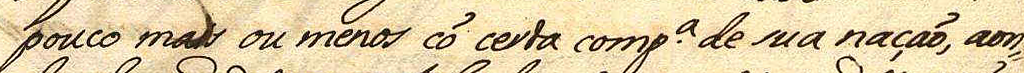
pouco mais ou menos cō certa comp.a de sua naçaõ, aon
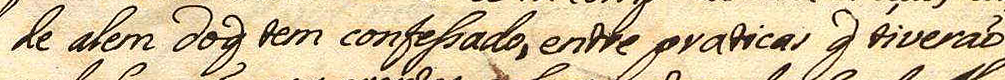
de alem do q̄ tem confessado, entre praticas q̄ tiveraõ
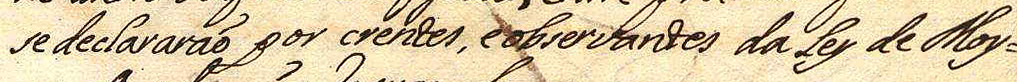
se declararaõ por crentes, e observantes da Ley de Moy
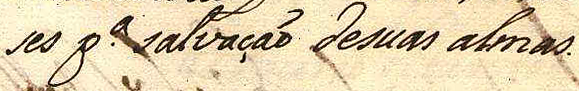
ses p.a salvaçaõ de suas almas.
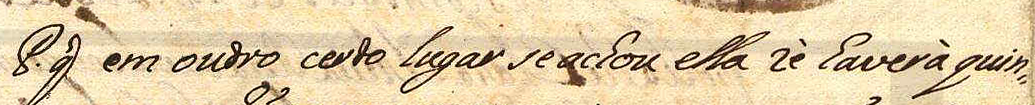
P. q̄ em outro certo lugar se achou ella rè haverà quin
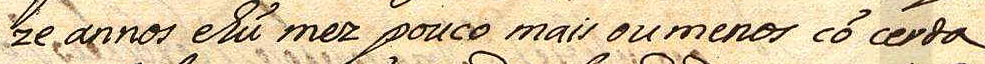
ze annos e hū mez pouco mais ou menos cō certa
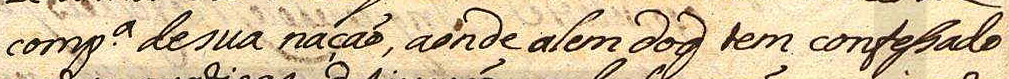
comp.a de sua naçaõ, aonde alem do q̄ tem confessado
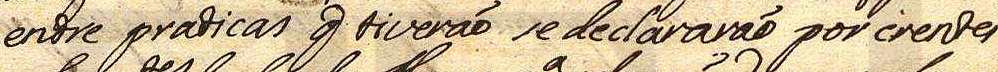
entre praticas q̄ tiveraõ se declararaõ por crentes
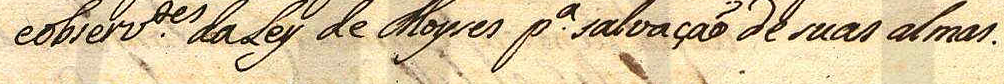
e observ.tes da Ley de Moyses p.a salvaçaõ de suas almas.
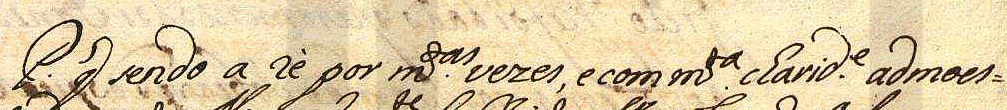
P. q̄ sendo a rè por m.tas vezes, e com mt.a charid.e admoes
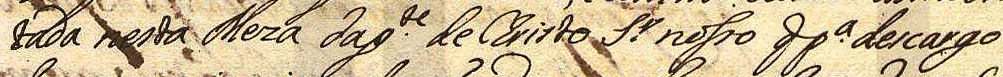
tada nesta Meza da p.te de Christo S.r nosso q̄ p.a descargo
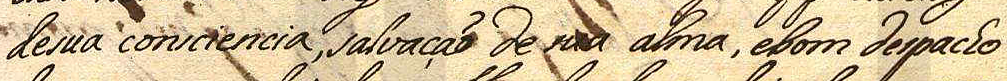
de sua consciencia, salvaçaõ de sua alma, e bom despacho
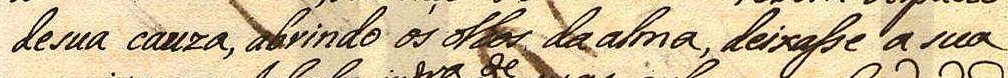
de sua cauza, abrindo os olhos da alma, deixasse a sua
